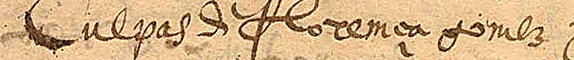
Culpas de floremça gomez ./.
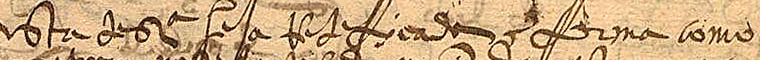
esta testa SeJa Retefycada ē forma como
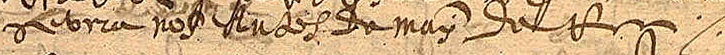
se vera nos Autos da maỹ da Ree ./.
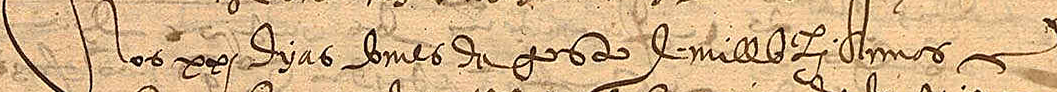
Aos xxj dyas do mes dagosto de mill bc Lj Annos ē
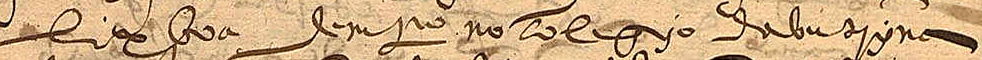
lixboa demtro no colegyo da doutryna
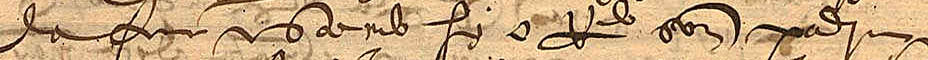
da fee estando hy o Rdo sōr padre
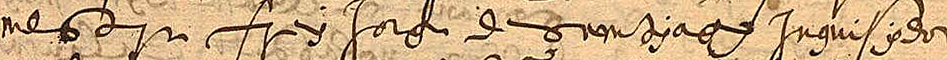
mestre frey Jorge de samtyago Jnquisydor
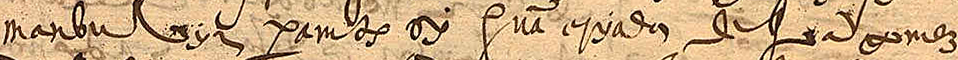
mandou vyr ꝑamte sy huā cryada de Joā gomez
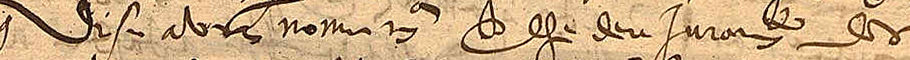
q̄ dise aver nome ma e lhe deu Juramto dos
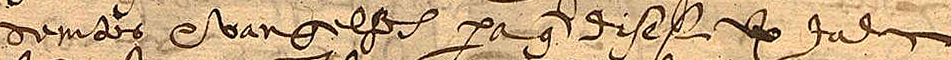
samtos evangelhos ꝑa q̄ disese ꝟdade
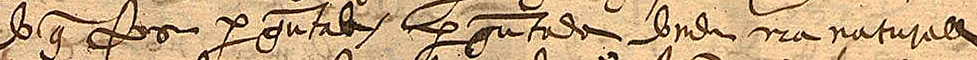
do q̄ fose ꝑḡutada/ ꝑḡutada donde era naturall
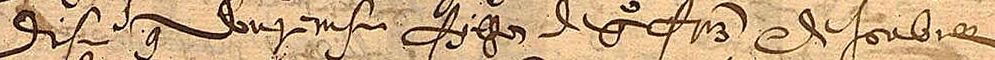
dise q̄ douremse fylha de go frz̄ e de Jsabell
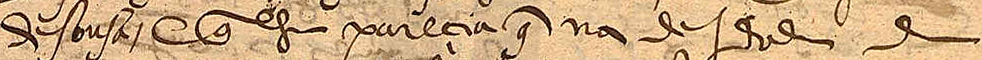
de sousa / e q̄ lhe pareçia q̄ era Jdade de
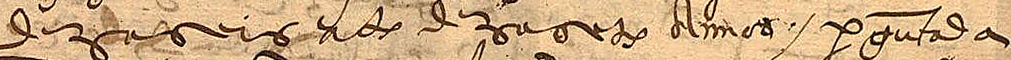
dezaseis ate dezasete Annos ./ ꝑḡutada
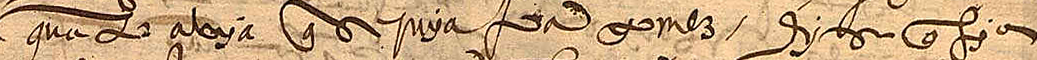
q̄uato avya q̄ seruya Joā gomez / dyse q̄ hya
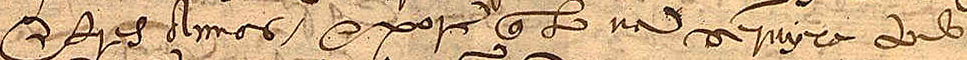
ē tres Annos / e porē q̄ ho nā seruyra todo
